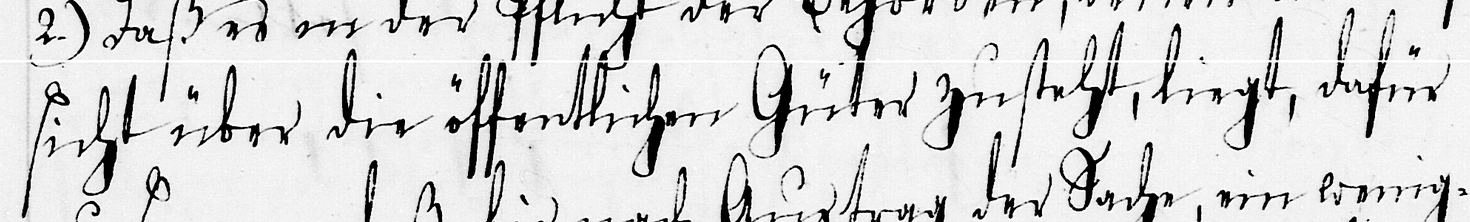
sicht über die öffentlichen Güter zusteht, liegt, dafür
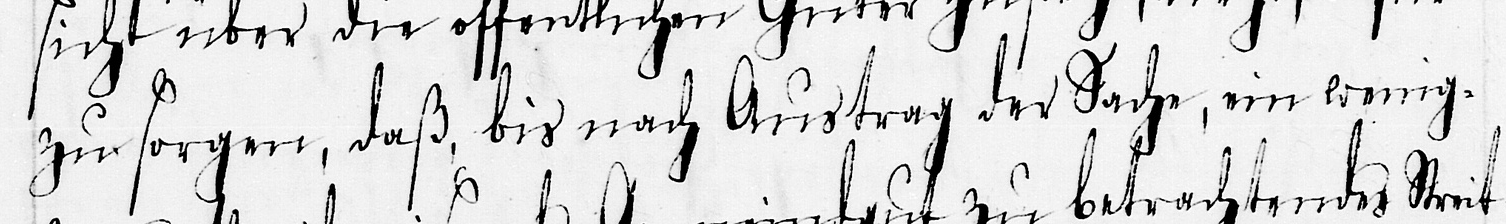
zu sorgen, daß, bis nach Austrag der Sache, ein wenig¬
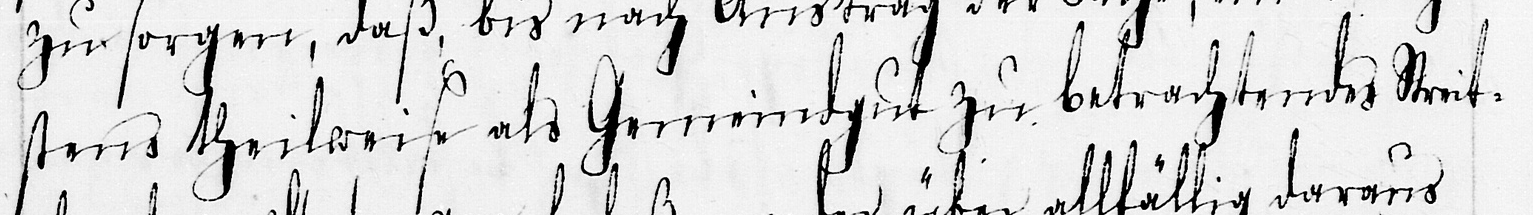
stens theilweise als Gemeindgut zu betrachtendes Streit¬
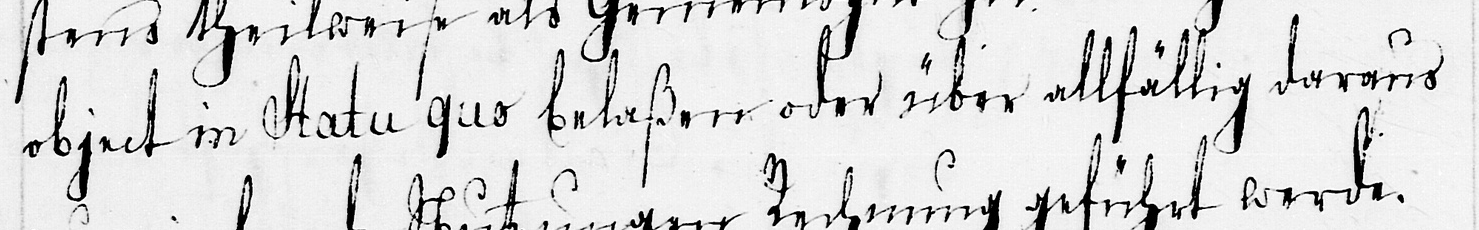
object in Statu quo belaßen oder über allfällig daraus
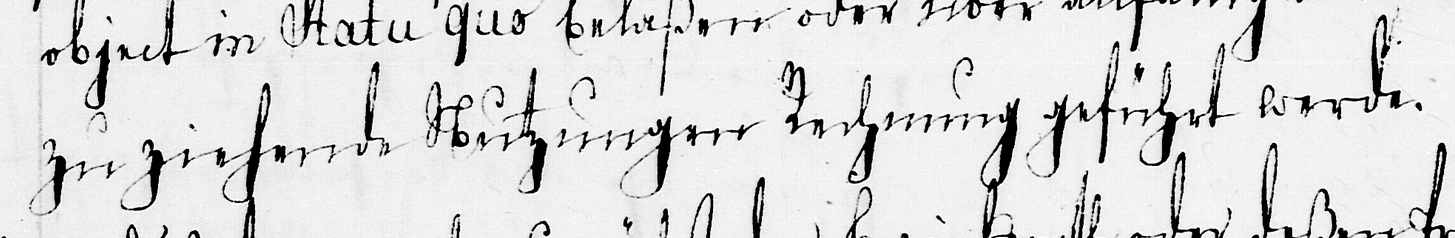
zu ziehende Nutzungen Rechnung geführt werde.
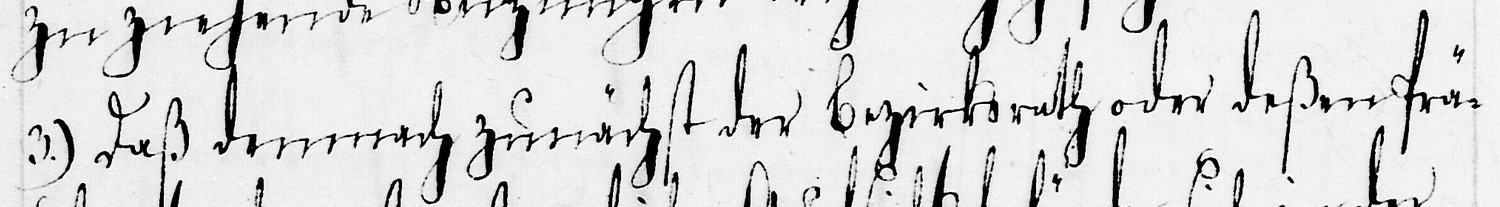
3.) Daß demnach zunächst der Bezirksrath oder deßen Prä¬
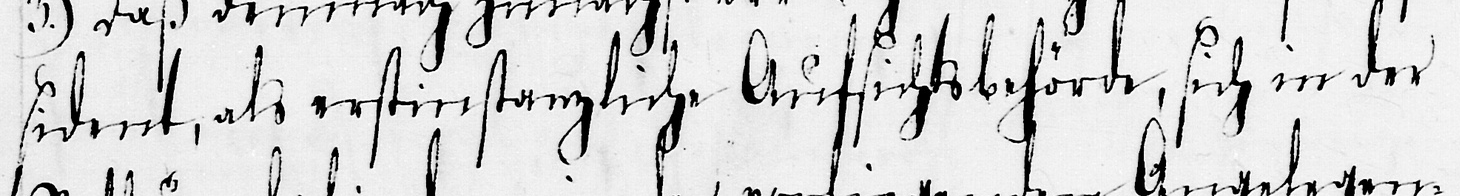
sident, als erstinstanzliche Aufsichtsbehörde, sich in der
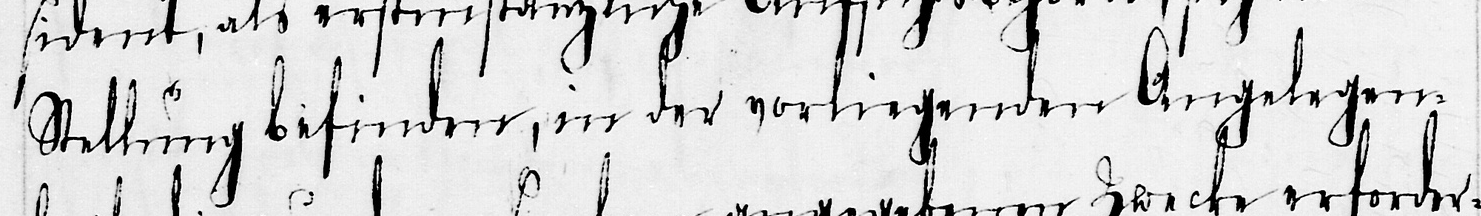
Stellung befinden, in der vorliegenden Angelegen¬
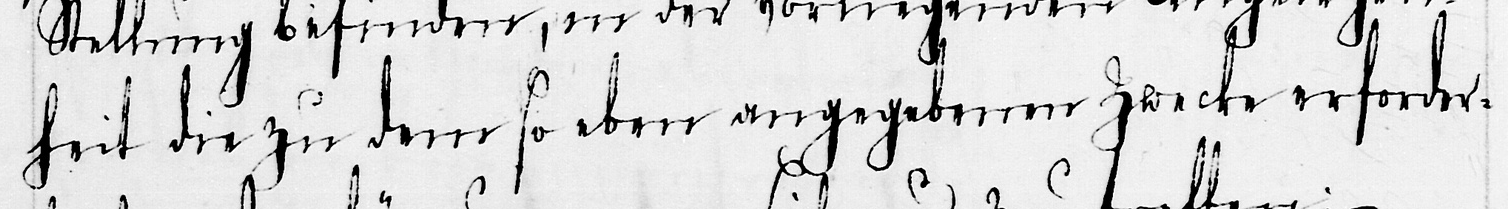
heit die zu dem so eben angegebenen Zwecke erforder¬
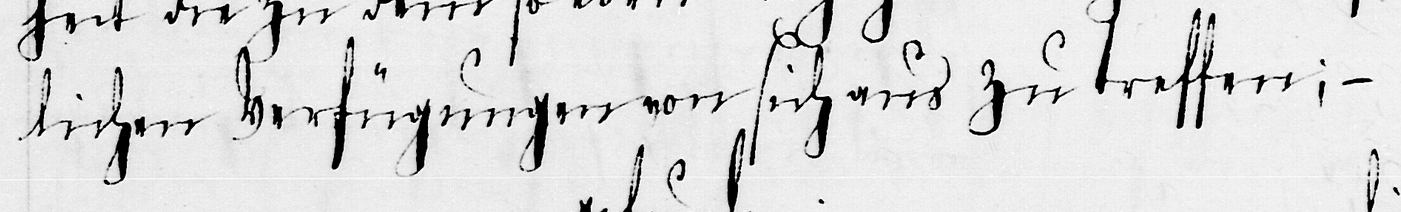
lichen Verfügungen von sich aus zu treffen; –
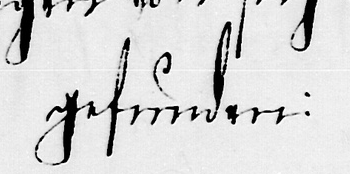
gefunden:
